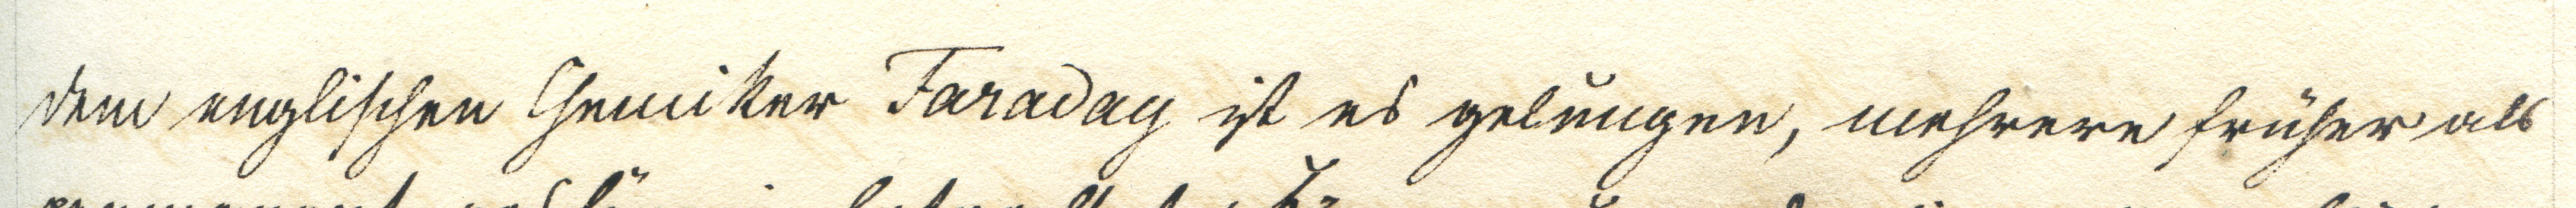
Dem englischen Chemiker Faraday ist es gelungen, mehrere früher als
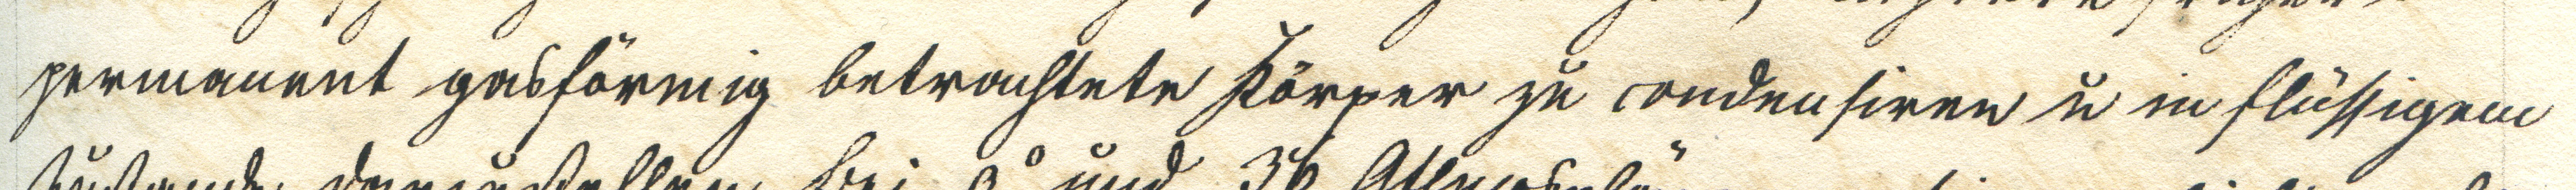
permanent gasförmig betrachtete Körper zu condensiren u in flüssigem
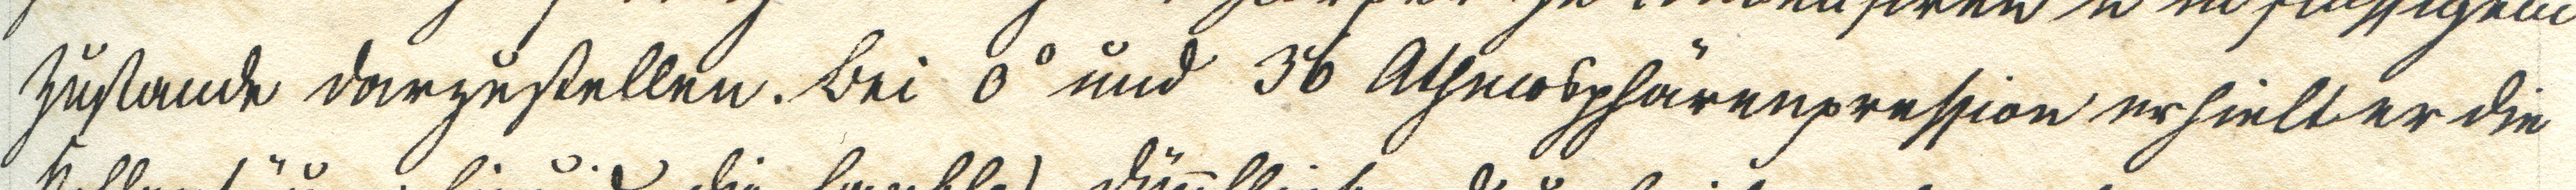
Zustande darzustellen. Bei 0° und 36 Athmosphärenpression erhielt er die
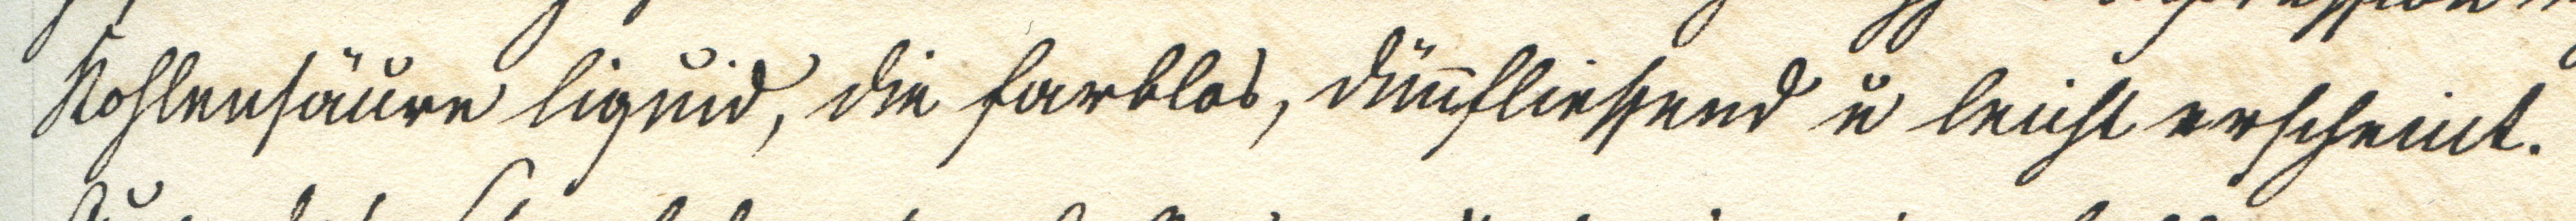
Kohlensäure liquid, die farblos, düñfliessend u leicht erscheint.
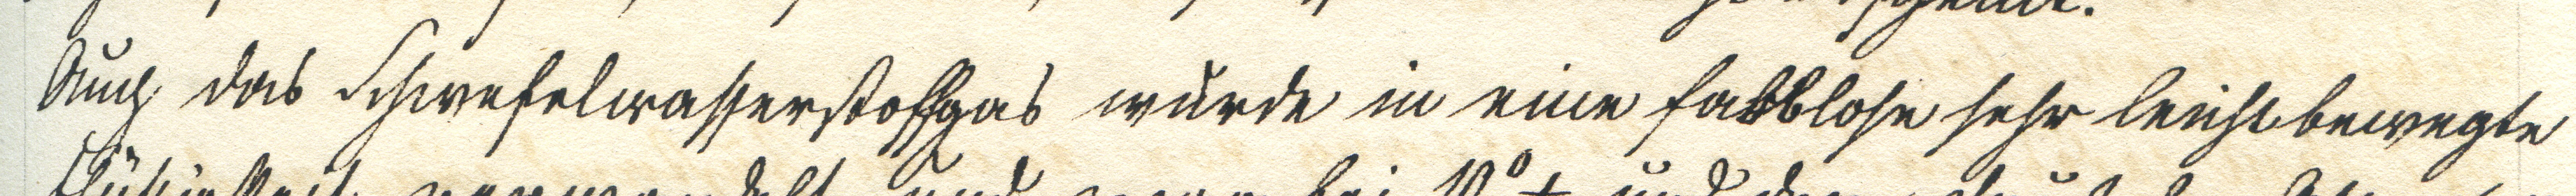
Auch das Schwefelwasserstoffgas wurde in eine fallrblose sehr leicht bewegte
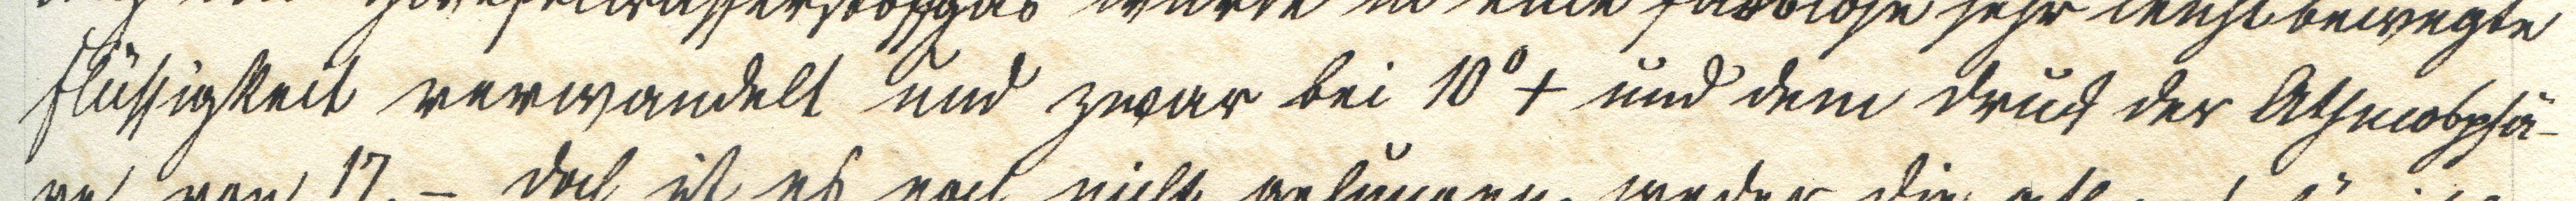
Flüssigkeit verwandelt und zwar bei 10°+ und dem Druck der Athmosphä-
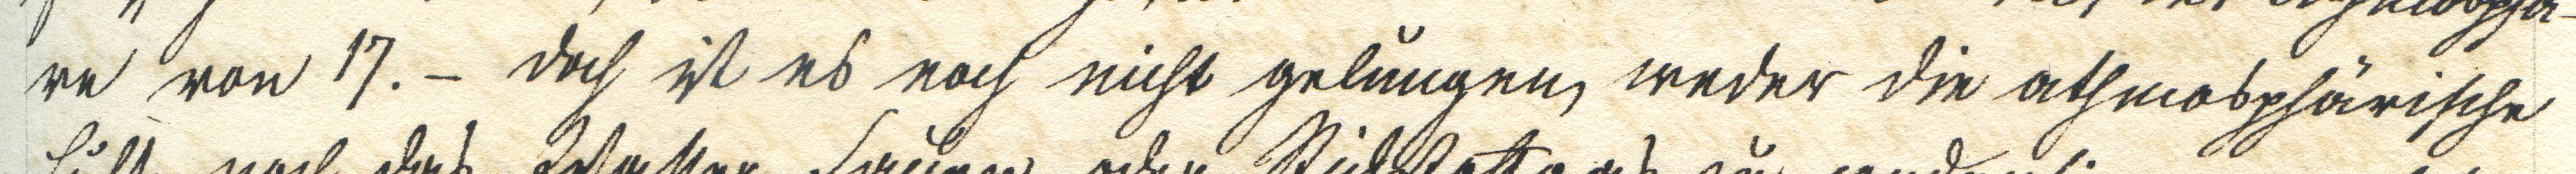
re von 17. – Doch ist es noch nicht gelungen, weder die athmosphärische
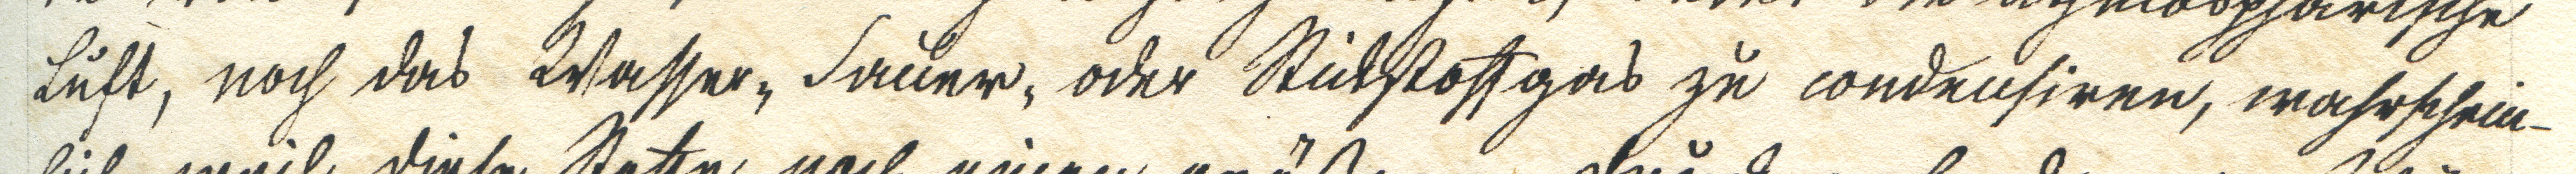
Luft, noch das Wasser- Sauer- oder Stickstoffgas zu condensiren, wahrschein-
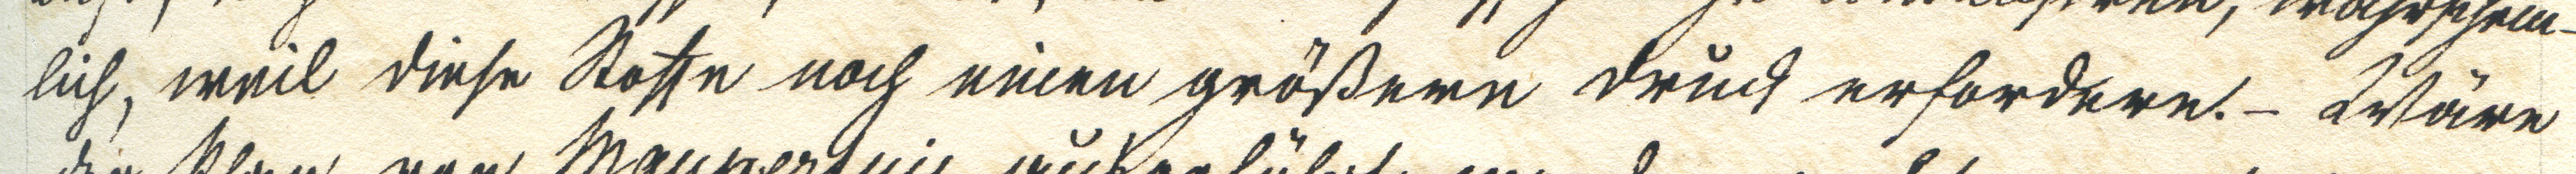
lich, weil diese Stoffe noch einen größern Druck erfodern. – Wäre
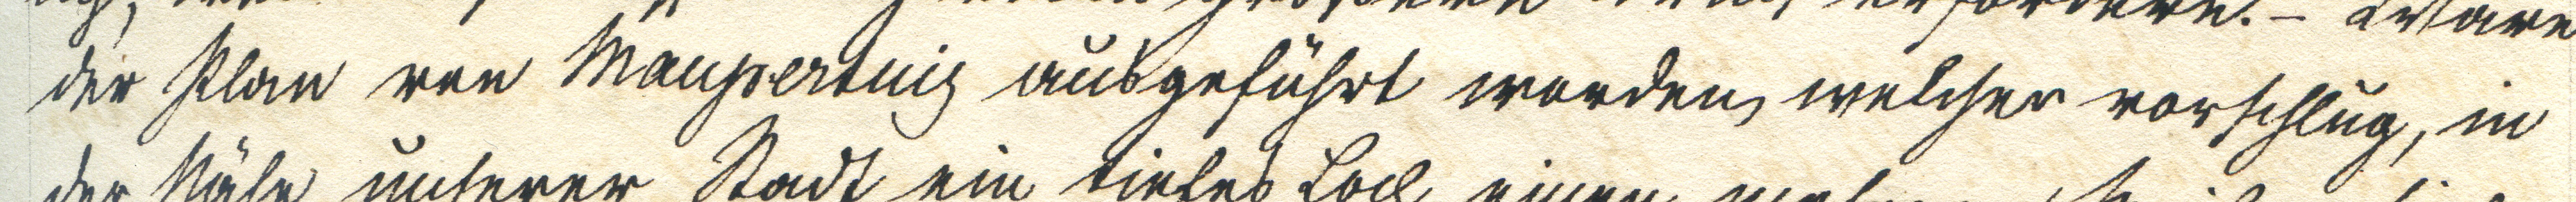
der Plan von Maupertuis ausgeführt worden, welcher vorschlug, in
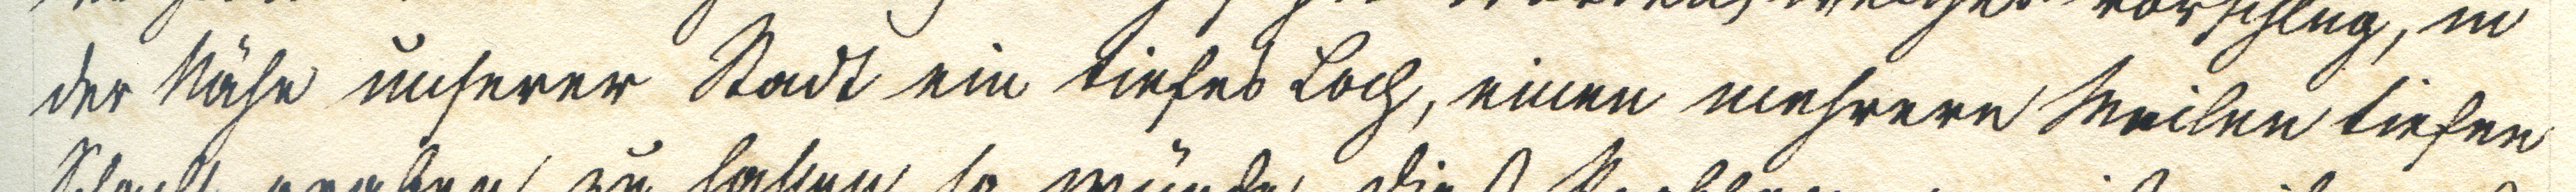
der Nähe unserer Stadt ein tiefes Loch, einen mehrere Meilen tiefen
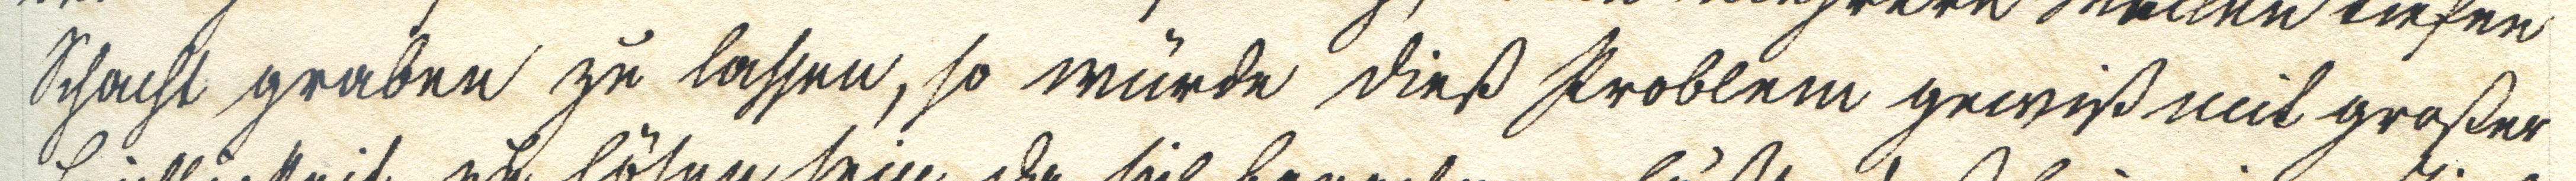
Schacht graben zu lassen, so würde dieß Problem gewiß mit großer
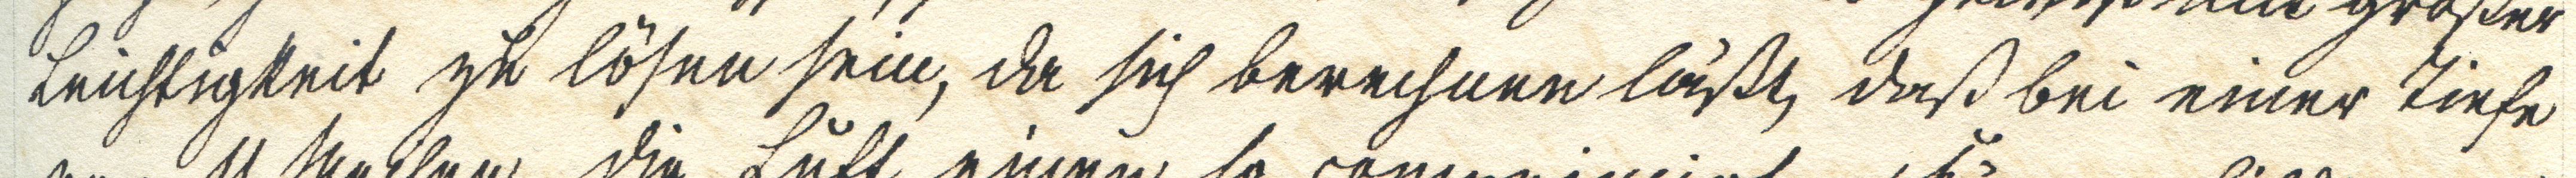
Leichtigkeit zu lösen sein, da sich berechnen läßt, daß bei einer Tiefe
